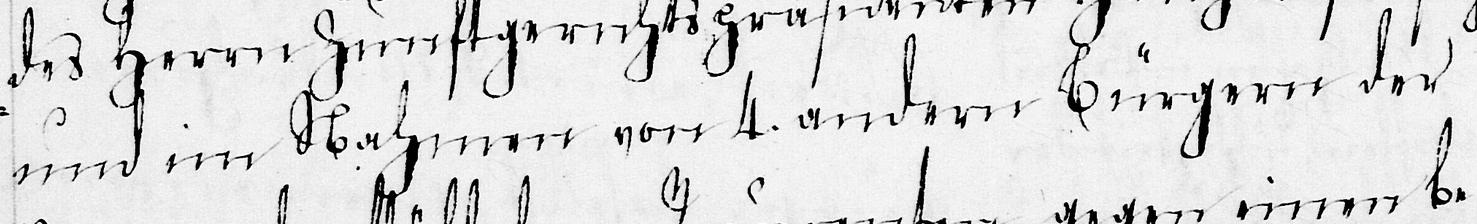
und im Nahmen von 4. andern Bürgern der
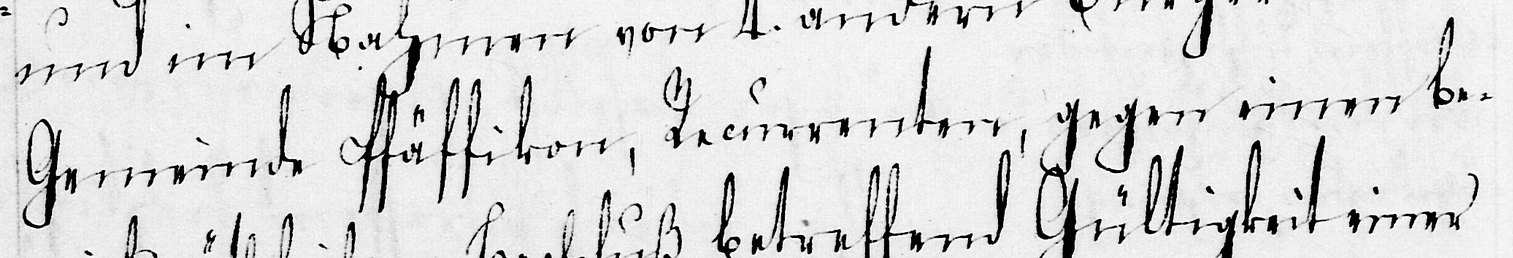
Gemeinde Pfäffikon, Recurrenten, gegen einen be¬
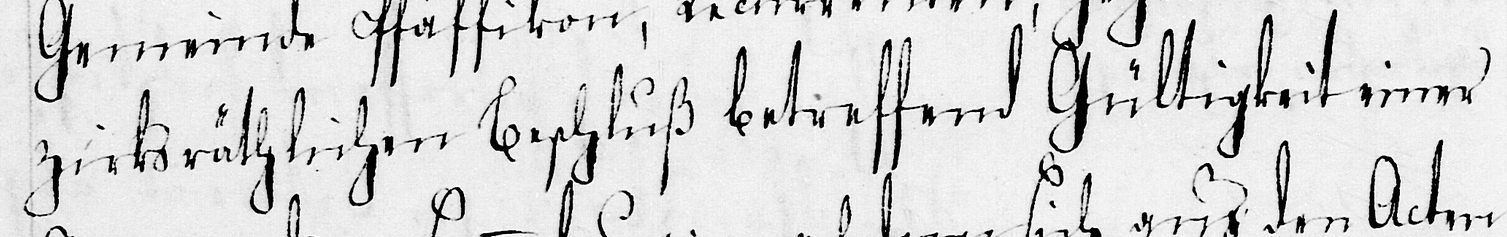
zirksräthlichen Beschluß betreffend Gültigkeit einer
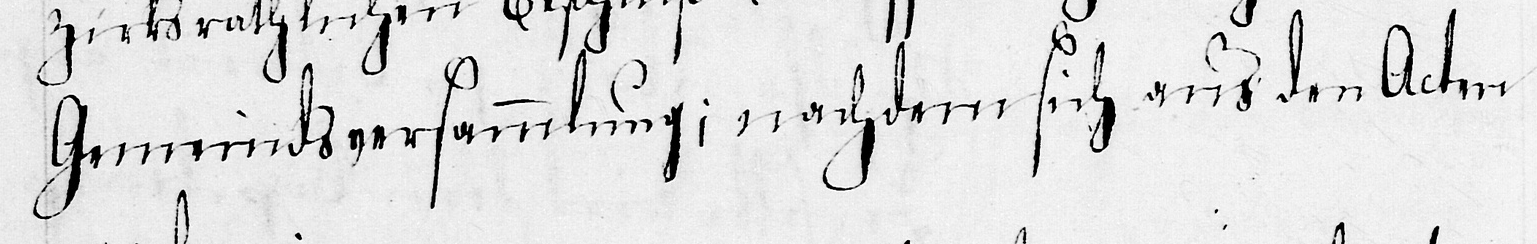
Gemeindsversammlung; nachdem sich aus den Acten
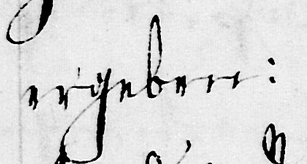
ergeben:
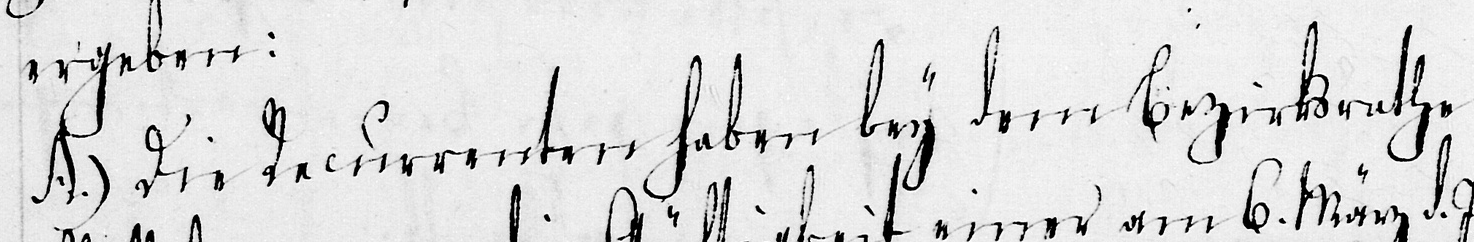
A.) Die Recurrenten haben bey dem Bezirksrathe
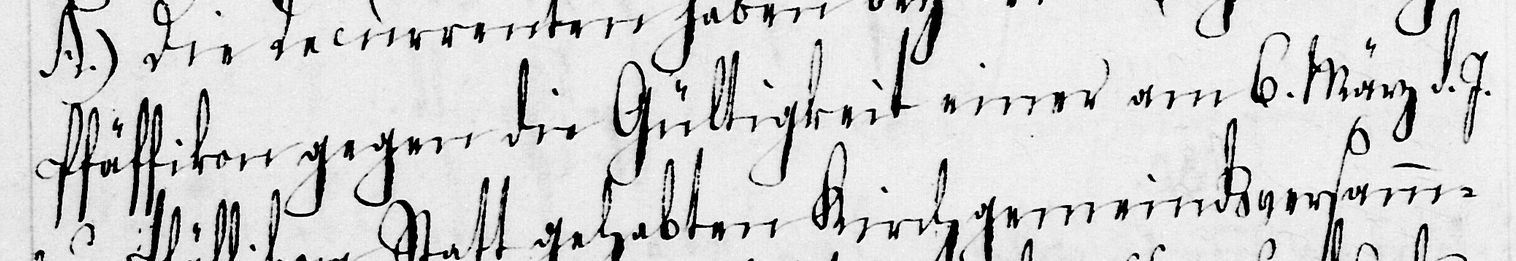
Pfäffikon gegen die Gültigkeit einer am 6. März d.
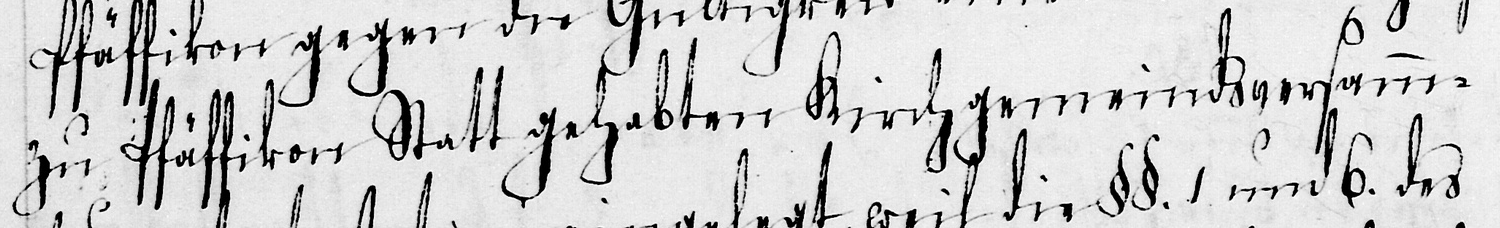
zu Pfäffikon Statt gehabten Kirchgemeindsversamm¬
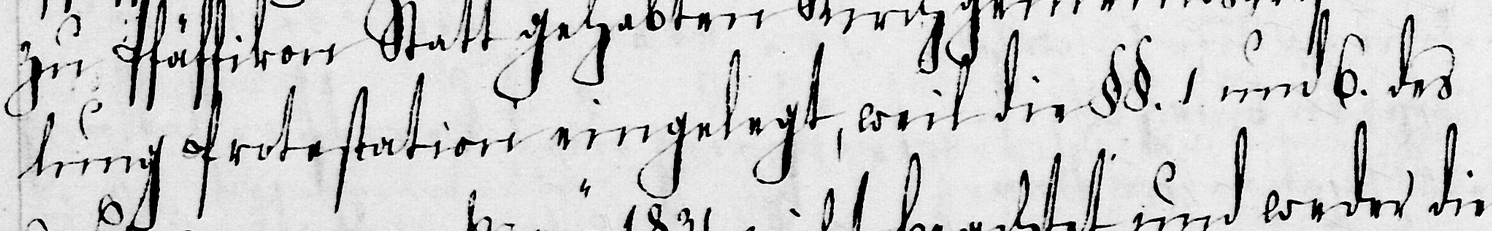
lung Protestation eingelegt, weil die §§. 1 und 6. des
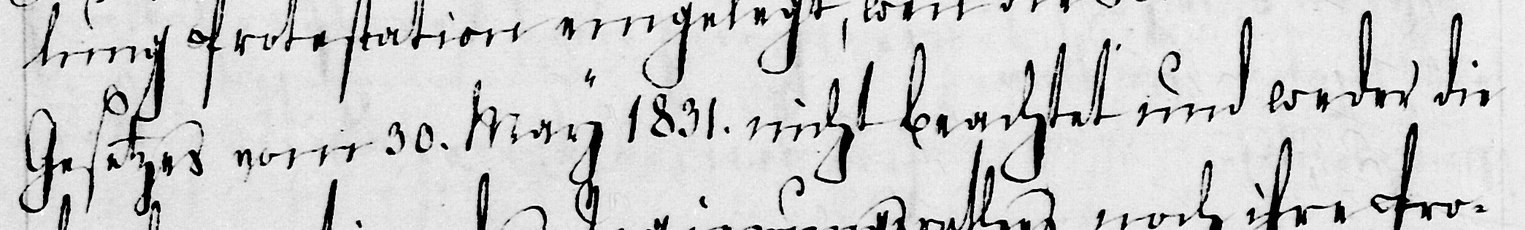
Gesetzes vom 30. May 1831. nicht beachtet und weder die
